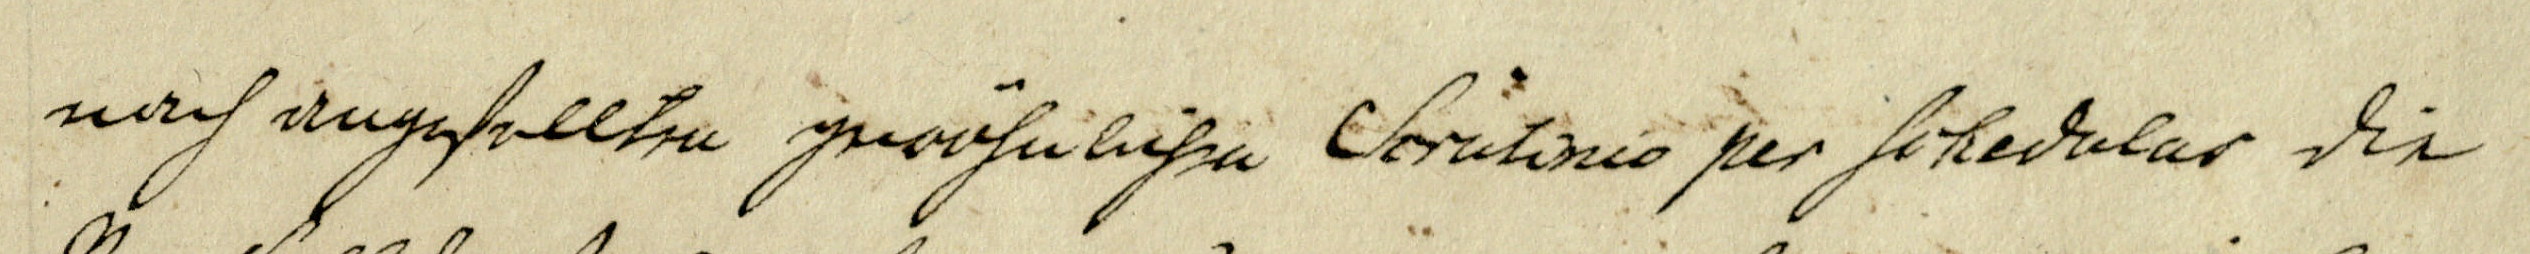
nach angestellten gewöhnlichen Scrutinio per Schedulas die
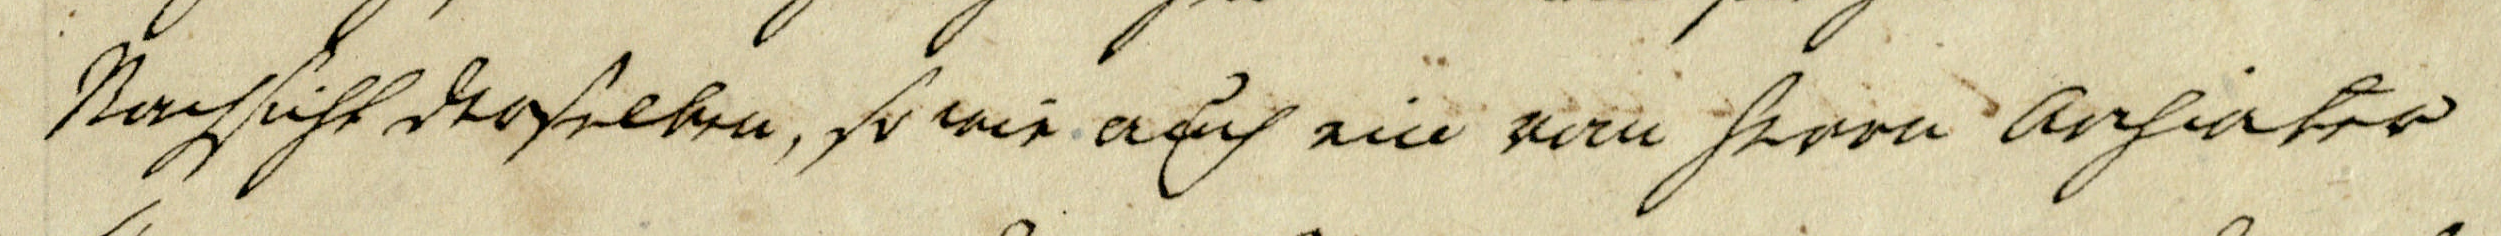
Nachsicht derselben, so wie auch ein vom Herrn Archiater
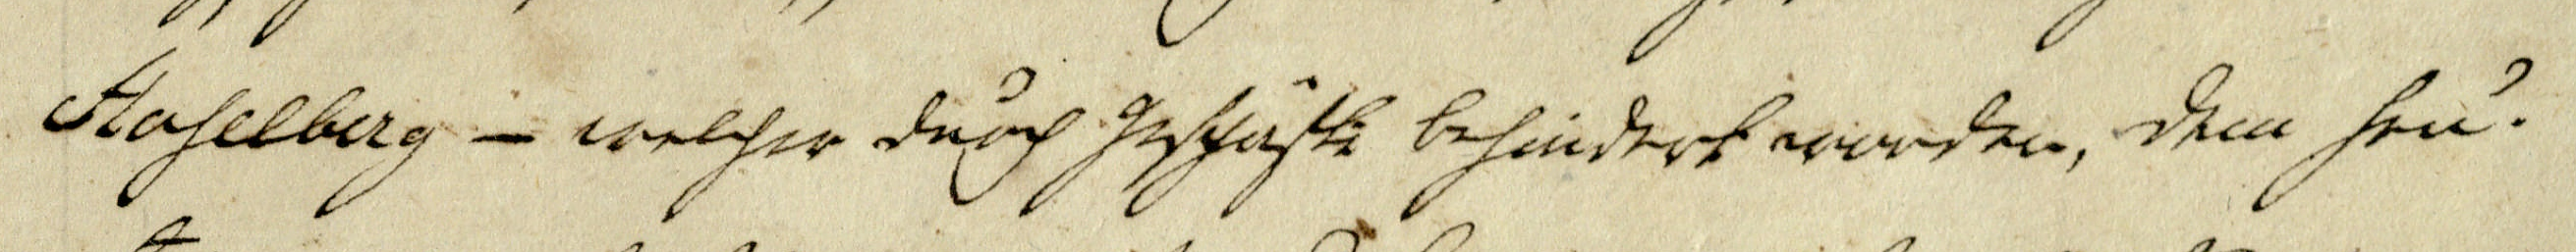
Haselberg welcher durch Geschäfte behindert worden, dem heu¬
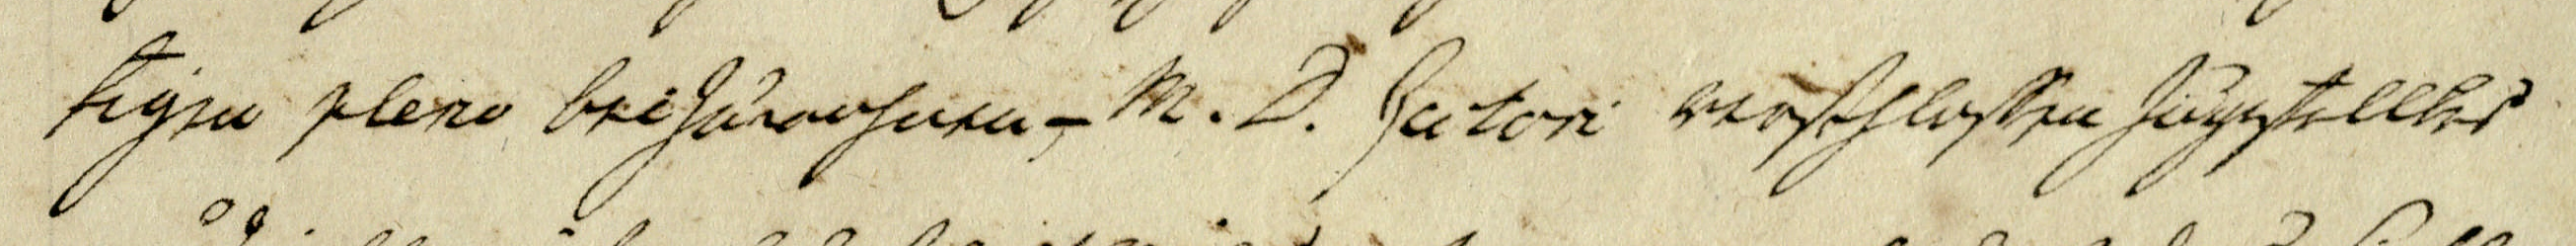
tigen pleno beizuwohnen M. D. Rectori verschlossen zugestelltes
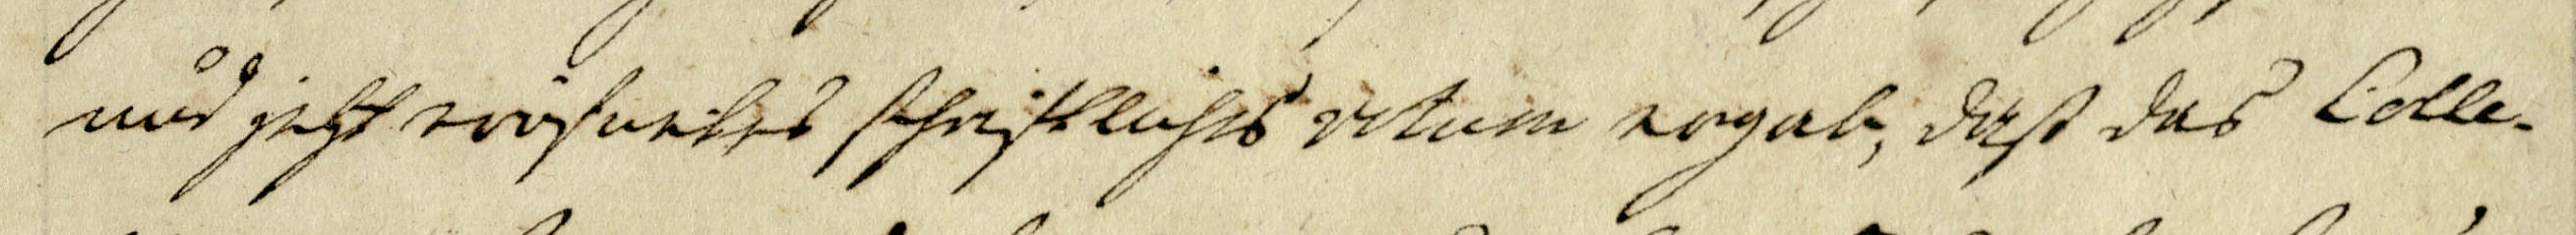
und jetzt eröfnetes schriftliches votum ergab, daß das Colle¬
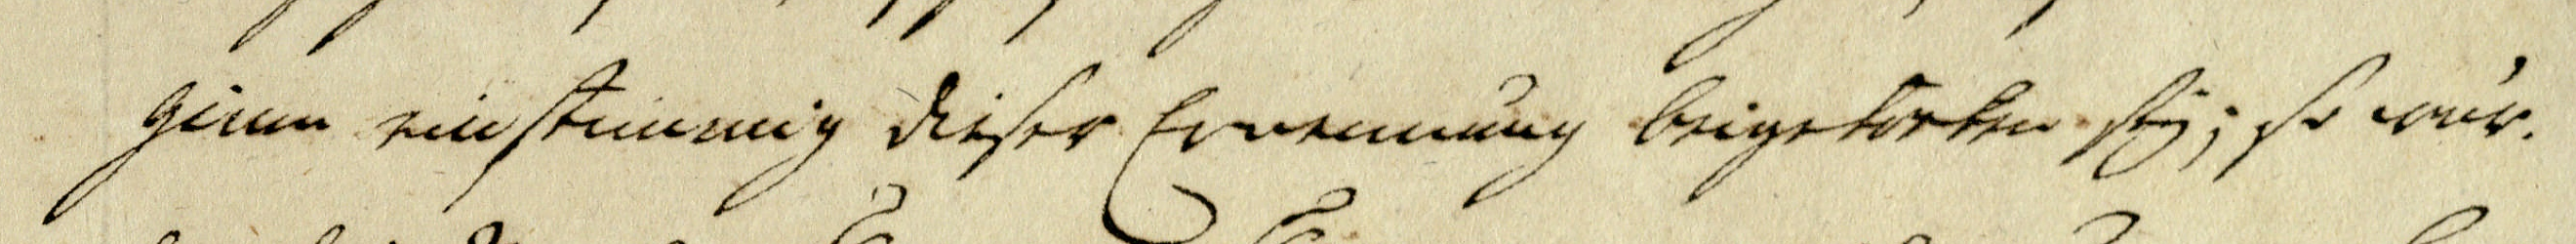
gium einstimmig dieser Ernennung beigetreten seÿ; so wur¬
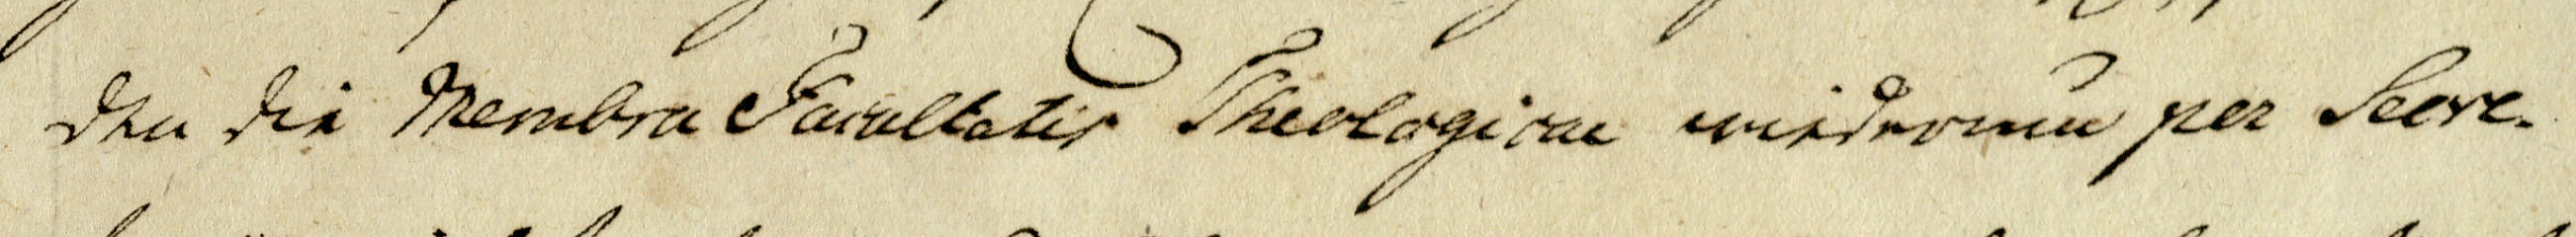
den die Membra Facultatis Theologicae wiederum per Secre¬
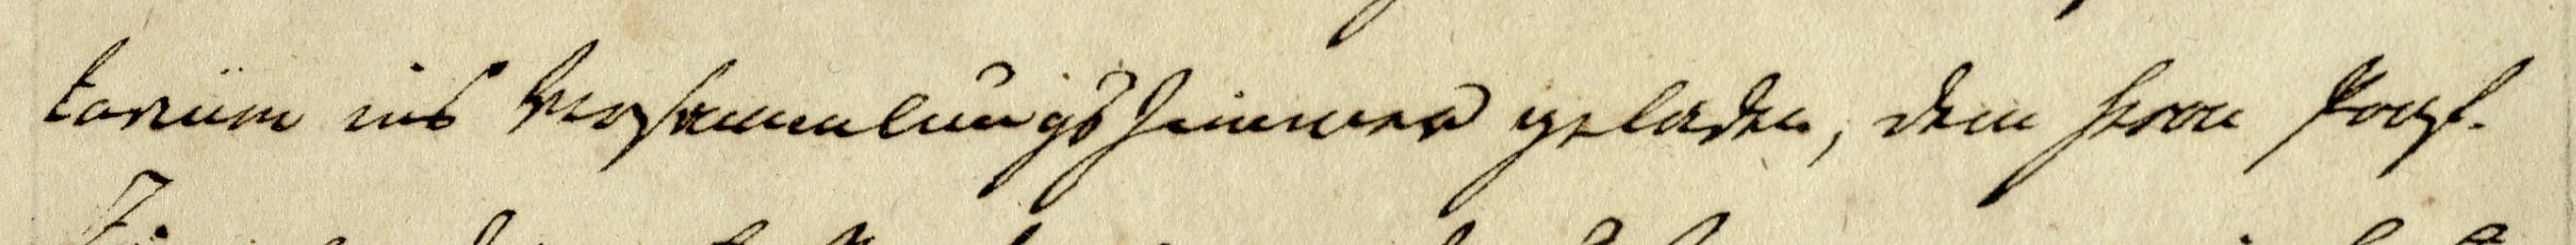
tarium ins Versammlungs Zimmer geladen, dem Herrn Prof.
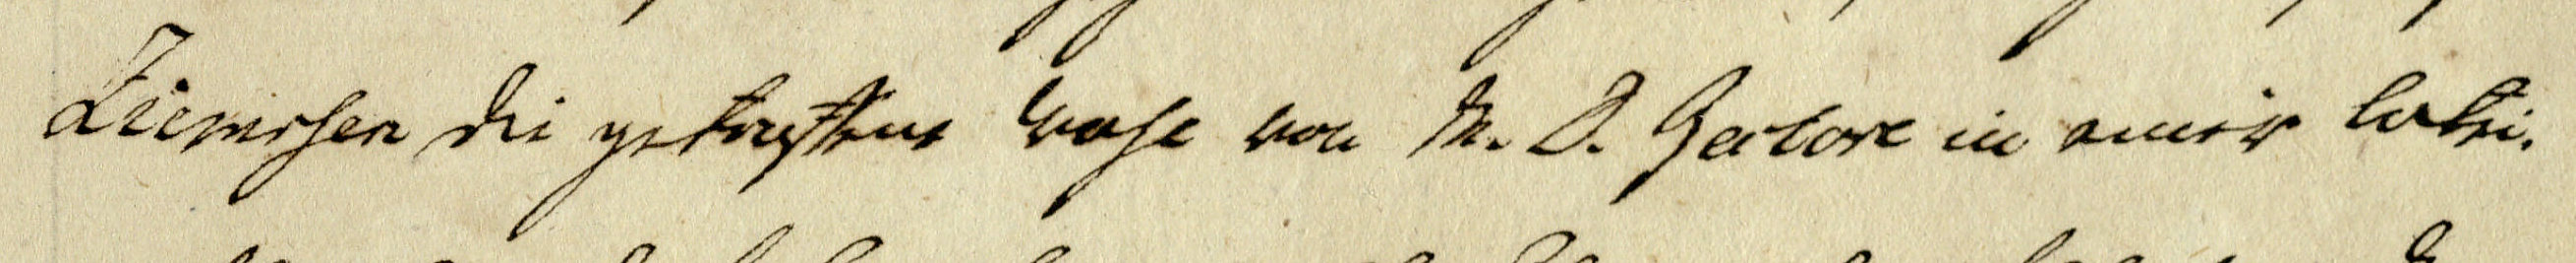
Ziemssen die getroffene Wahl von M. D. Rectore in einer latei¬
